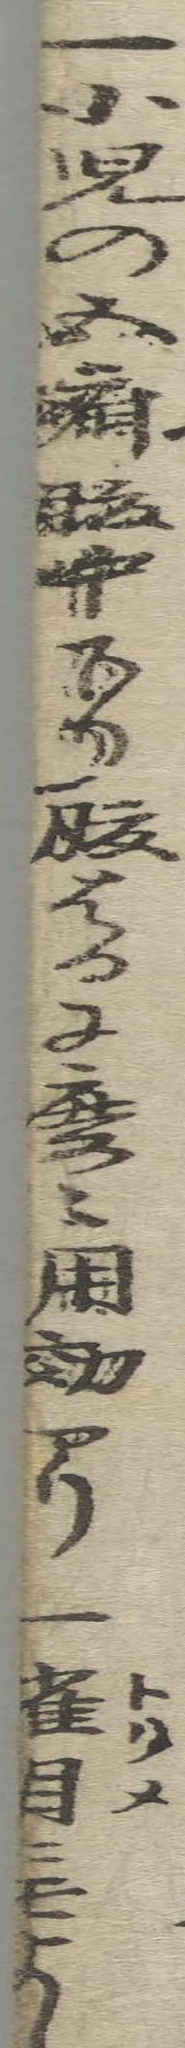一小児の五疳腹中下り腹はるに度々用効アリ一雀目にもよし

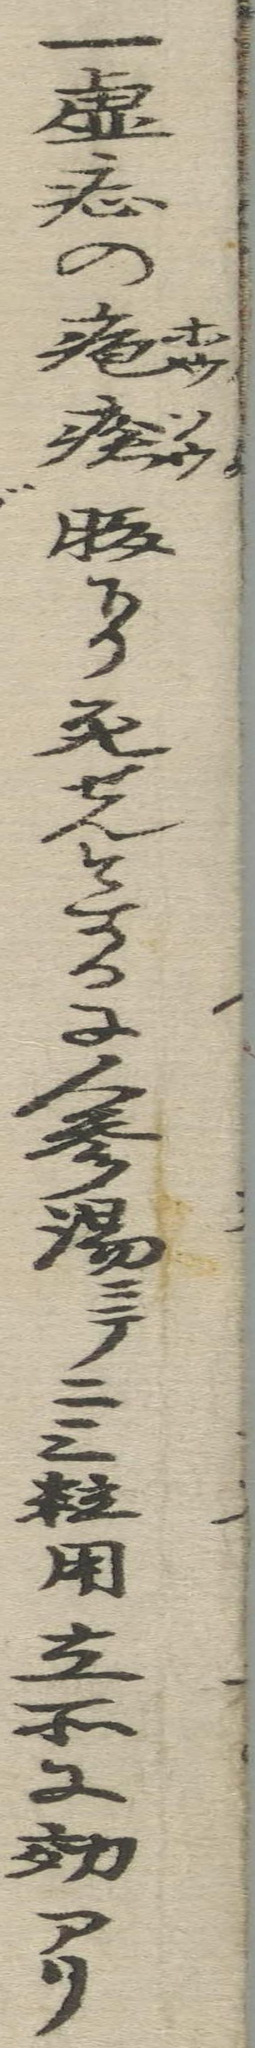一虚症の疱瘡腹下り死せんとするに人参湯にて二三粒用立所に効アリ
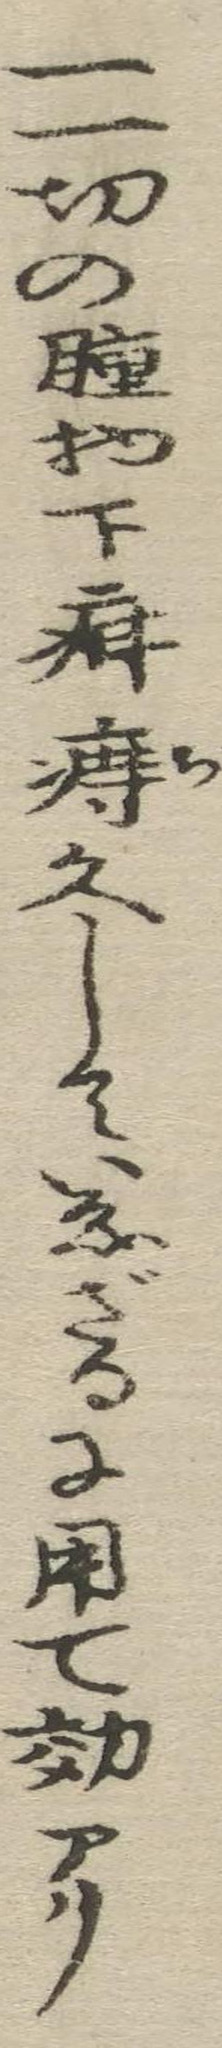一一切の腫物下痢痔久していゑざるに用て効アリ
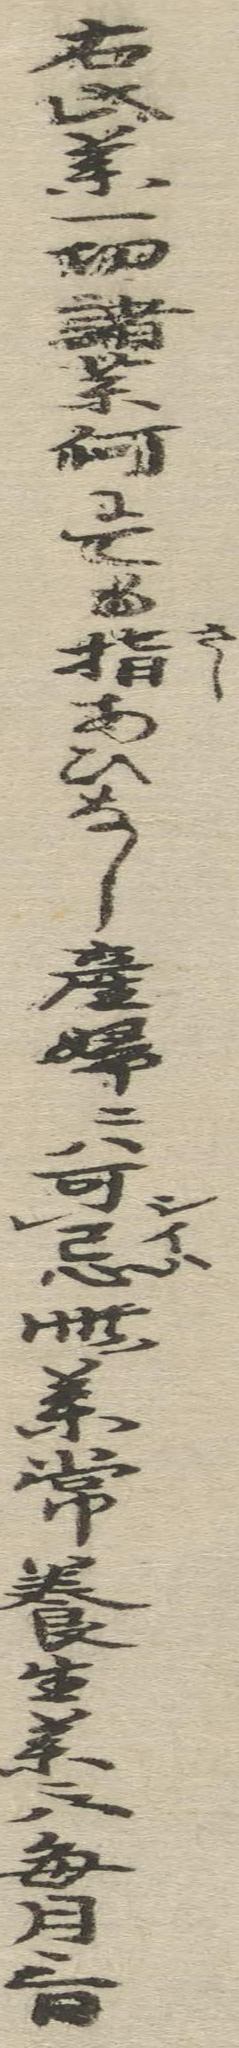右此薬一切諸薬何にても指あひなし産婦には可忌此薬常養生薬には毎月三日
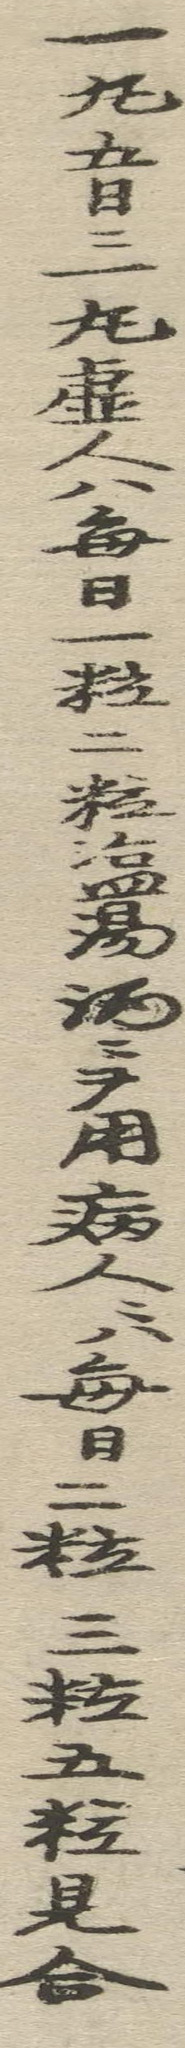一丸五日に一丸虚人は毎日一粒二粒塩湯酒にて用病人には毎日二粒三粒五粒見合
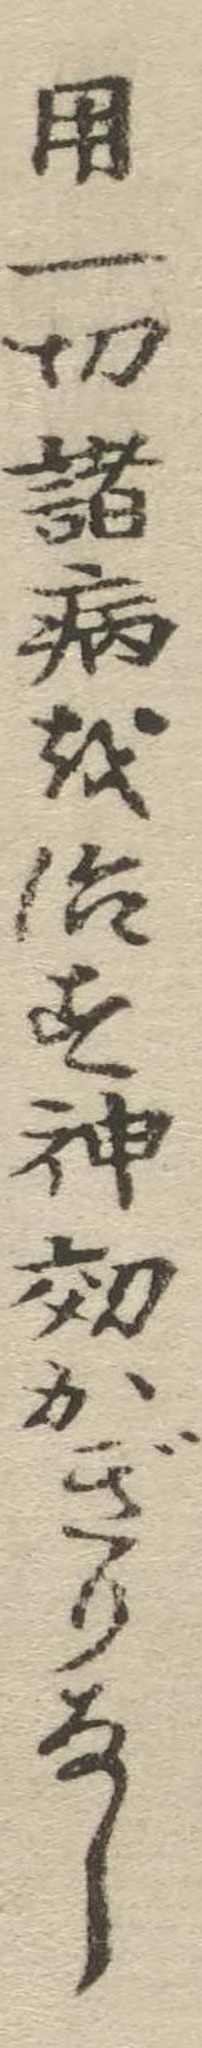用一切諸病を治す神効かぎりなし
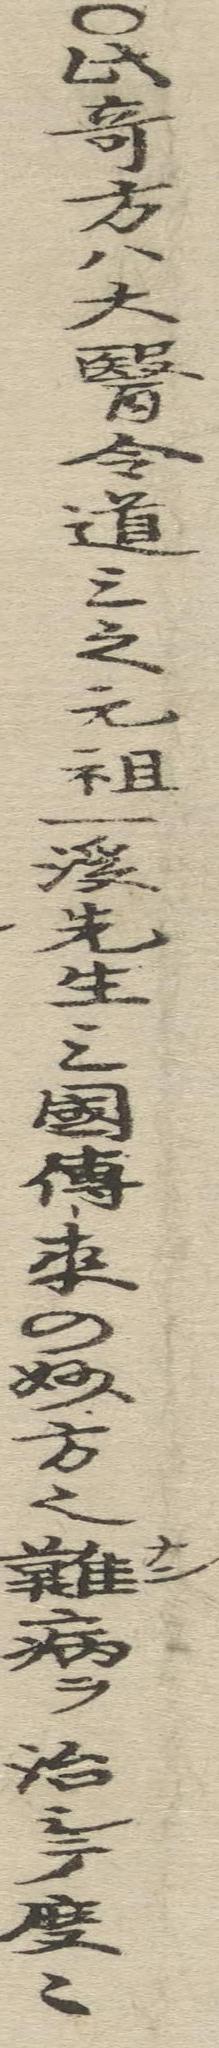○此竒方は大医令道三之元祖一渓先生三国伝-来の妙方也難病を治して度々
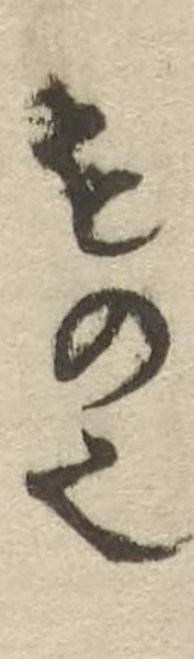もの也
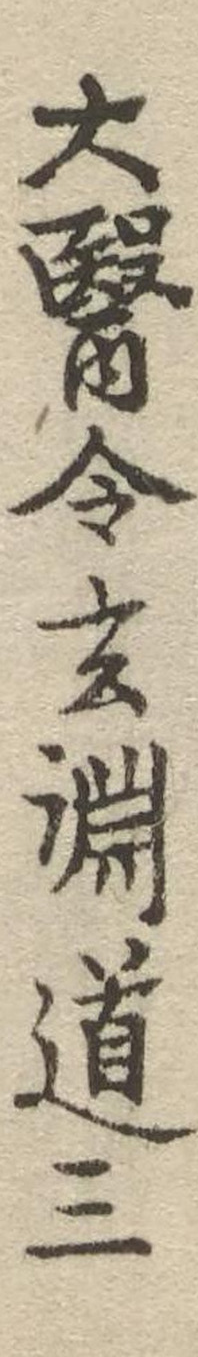大医令玄淵道三
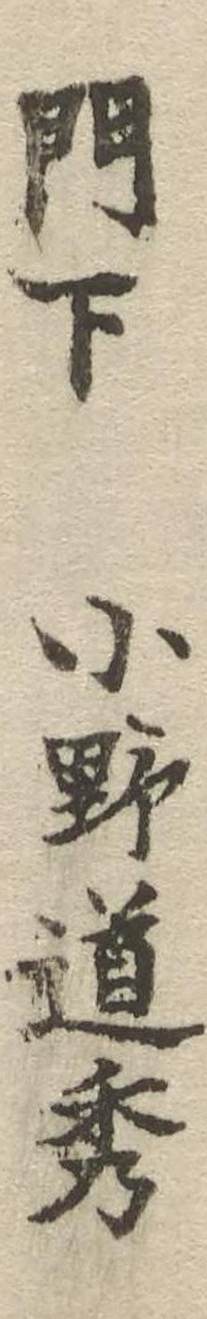門下小野道秀
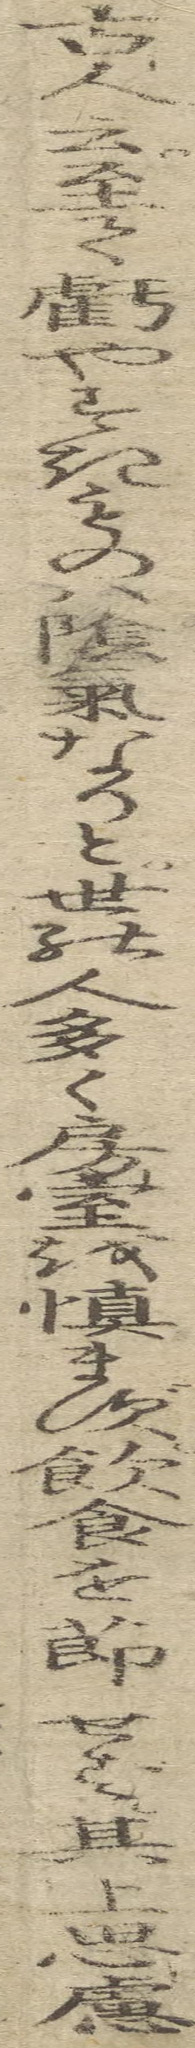古-人云。至て虧やすきものは陰気なりと。世の人多く房-室を慎まず飲食を莭せす。其上思-慮
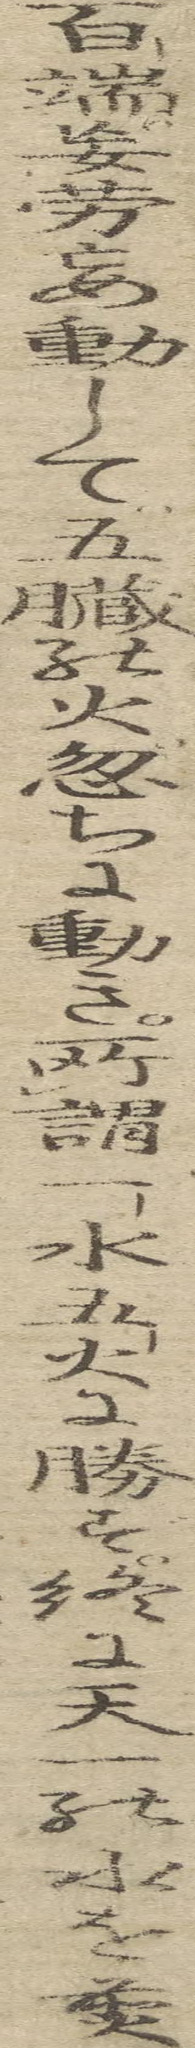百-端。妄労妄動して。五臓の火。忽ちに動き。所謂一-水五-火に勝ず。終に天一の水を煎
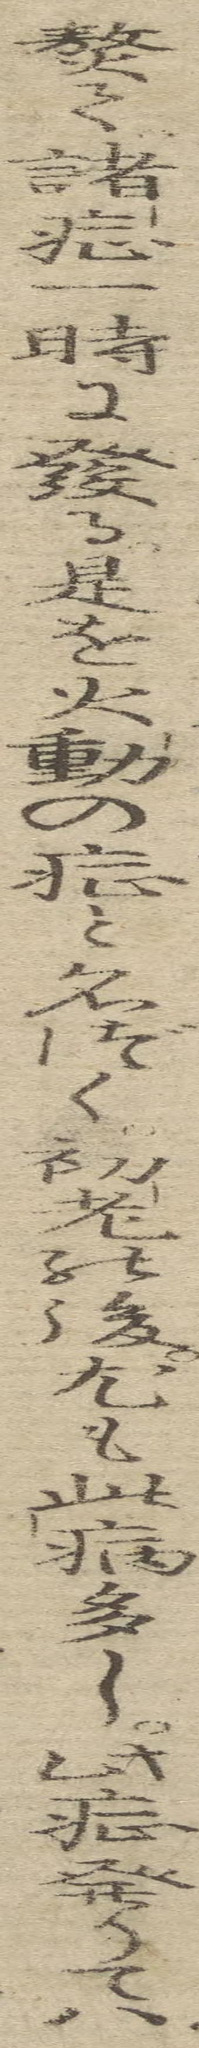熬て諸-症一時に発る。是を火-動の症と名づく。初-老の後。尤も此-病多し。此症発りては。
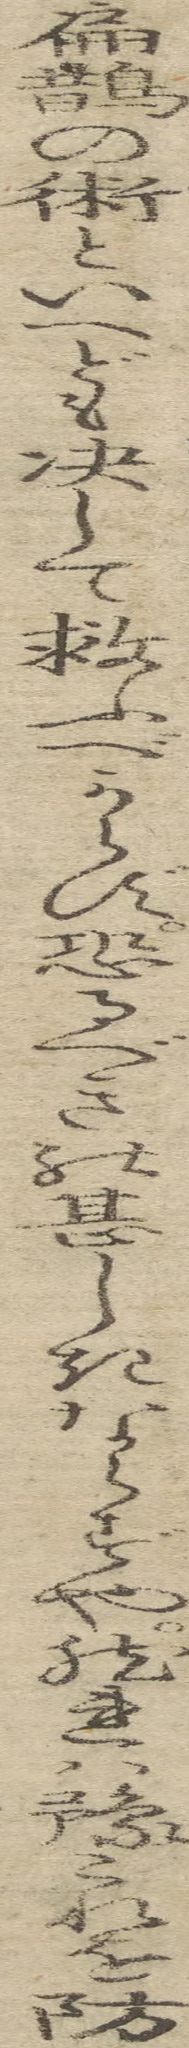扁鵲の術といへども決して救ふべからず。恐るべきの甚しきならずや。然れは豫これを防
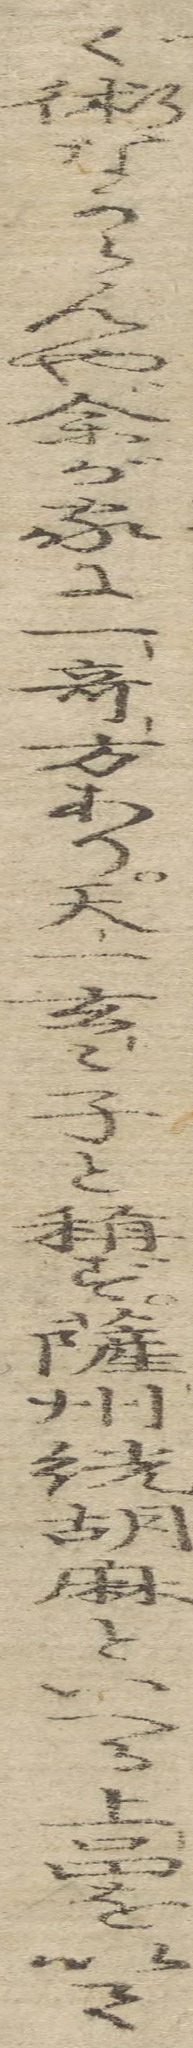ぐ術なからんや。余が家に一-竒-方あり。天-一玄-々子と称ず。薩-州絖胡麻といへる上-品を以て
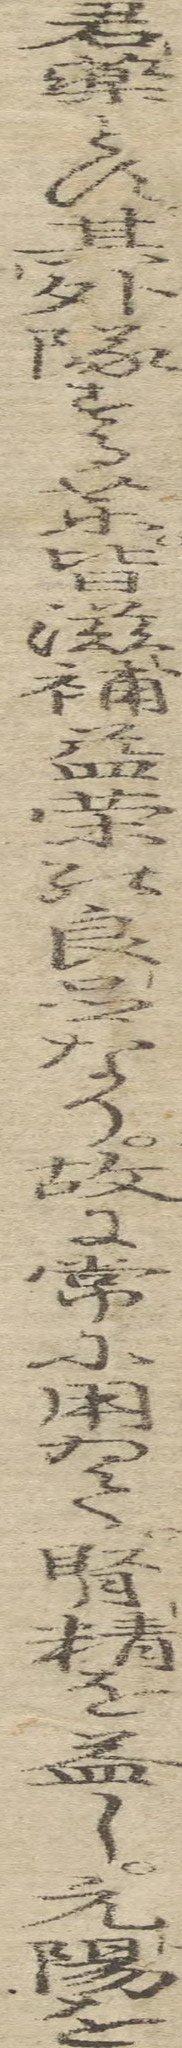君-薬とす。其-外隊する薬。皆滋-補益栄の良-品なり。故に常に用ゐて。腎-精を益し。元-陽を
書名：浪華薬種問屋能書張交帖. 二
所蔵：国立国会図書館 National Diet Library, JAPAN
